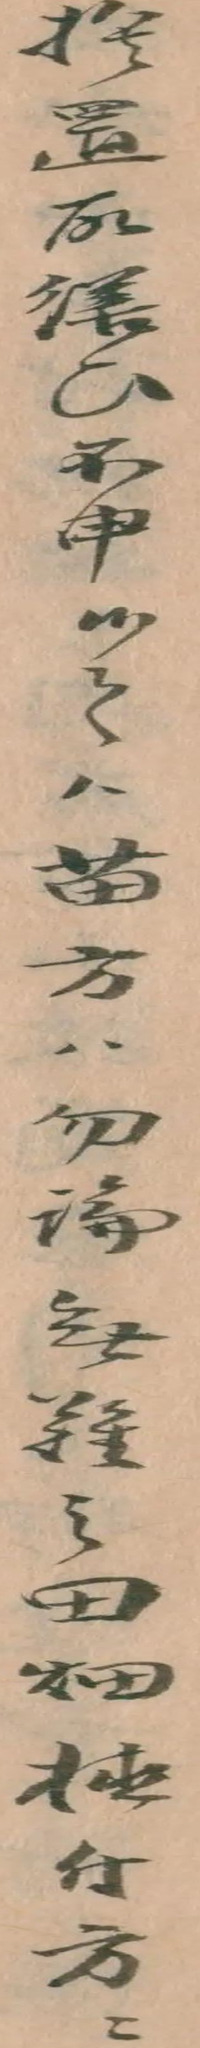捨置取繕ひ不申候てハ苗方ハ勿論無難之田畑植付方ニ
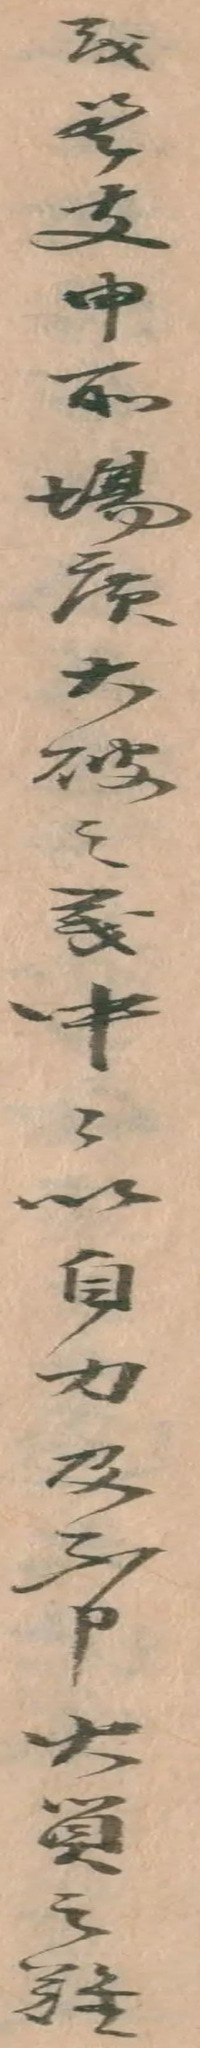も差支申所場広大破之義中々以自力及不申火災之難
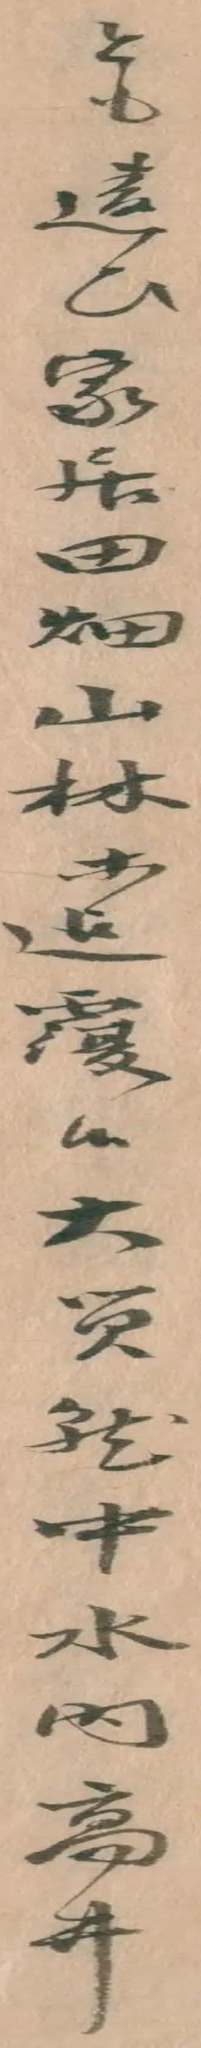とも違ひ家居田畑山林等迄覆候大災就中水内高井
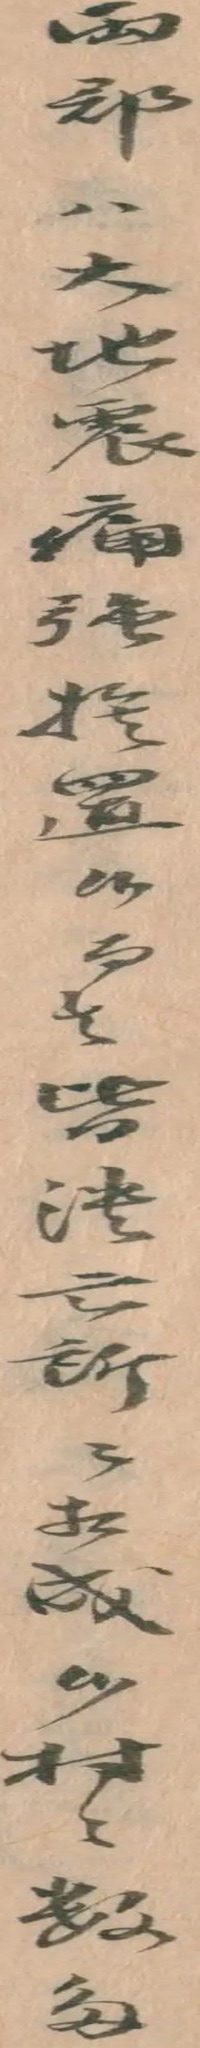両郡ハ大地震痛強捨置候而者皆潰亡所ニ相成候村々数多
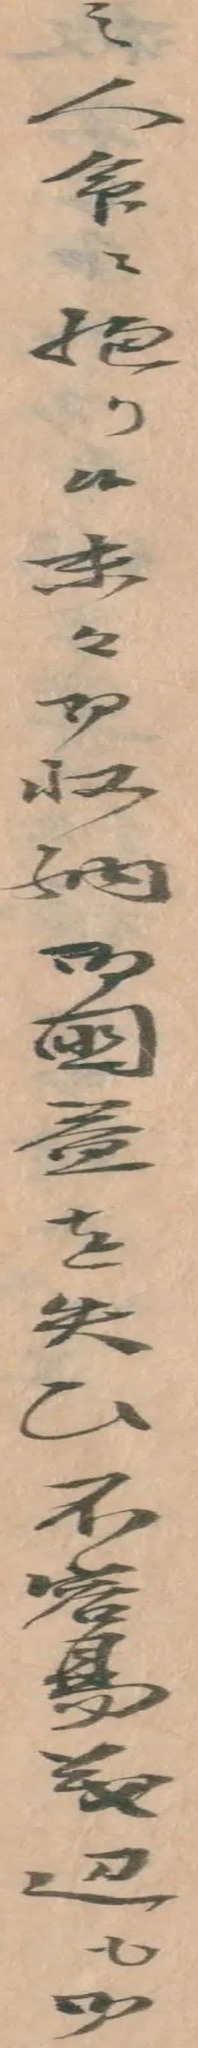之人命二拘り候末々御収納御国益を失ひ不容易義辺も御

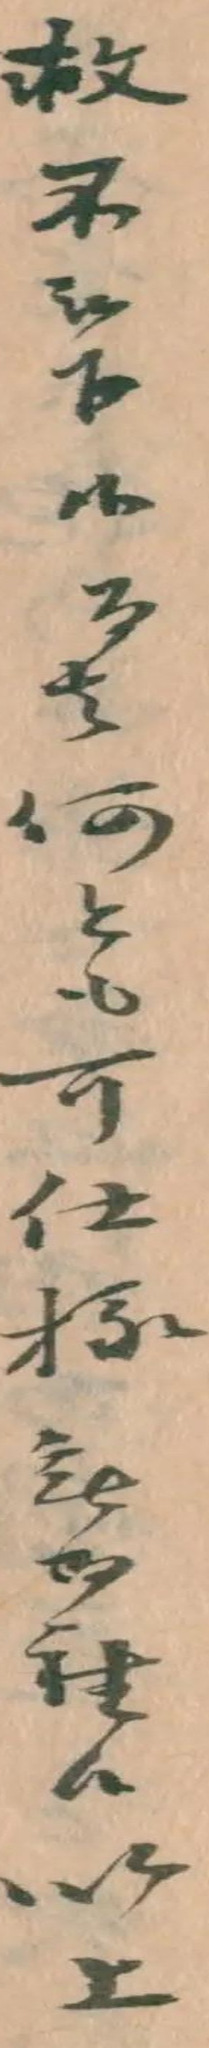救不被下候而者何とも可仕様無御座候以上
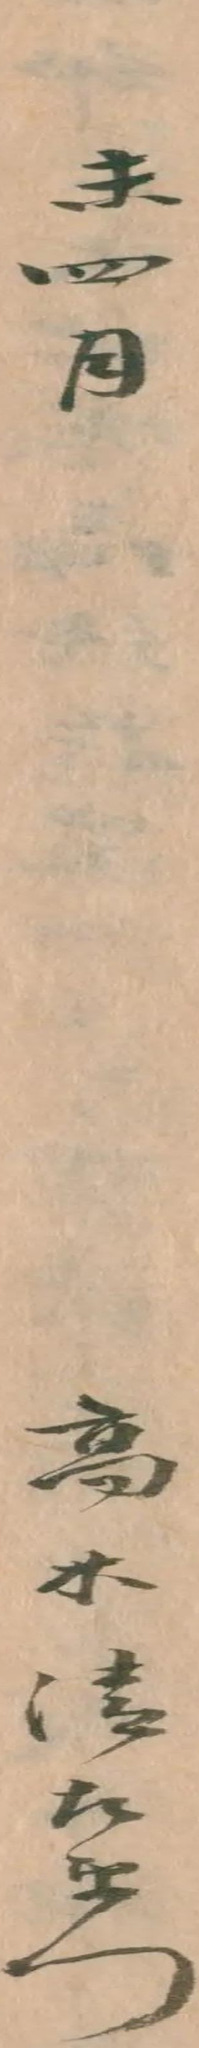未四月高木清左衛門
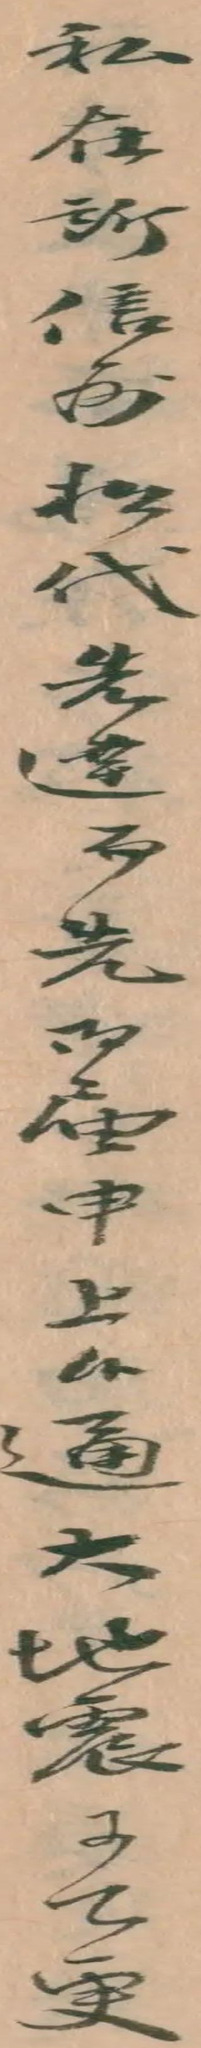私在所信州松代先達而先御届申上候通大地震にて更
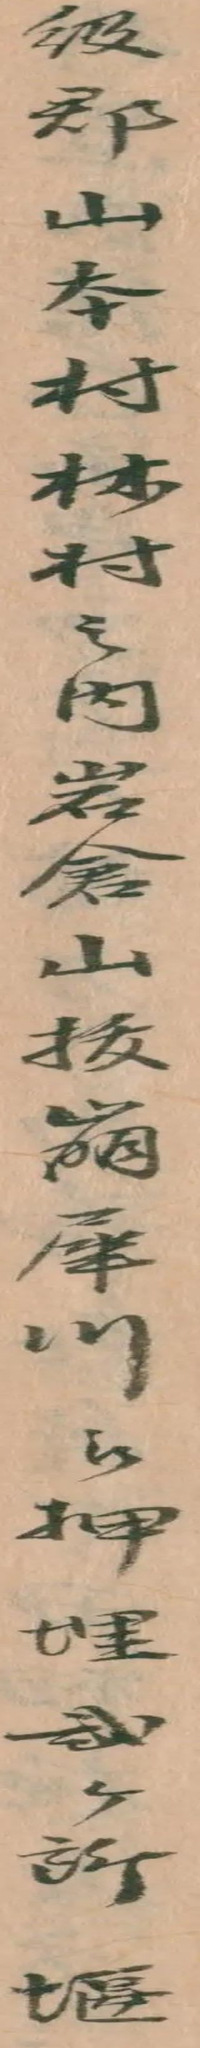級郡山平村林村之内岩倉山抜崩犀川江押埋弐ケ所堰
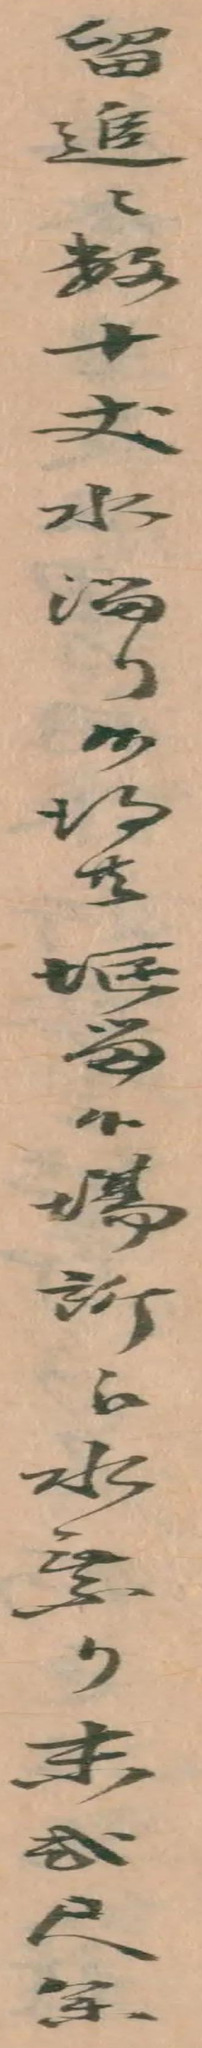留追々数十丈水溜候得共堰留候場所江水乗り未弐尺余
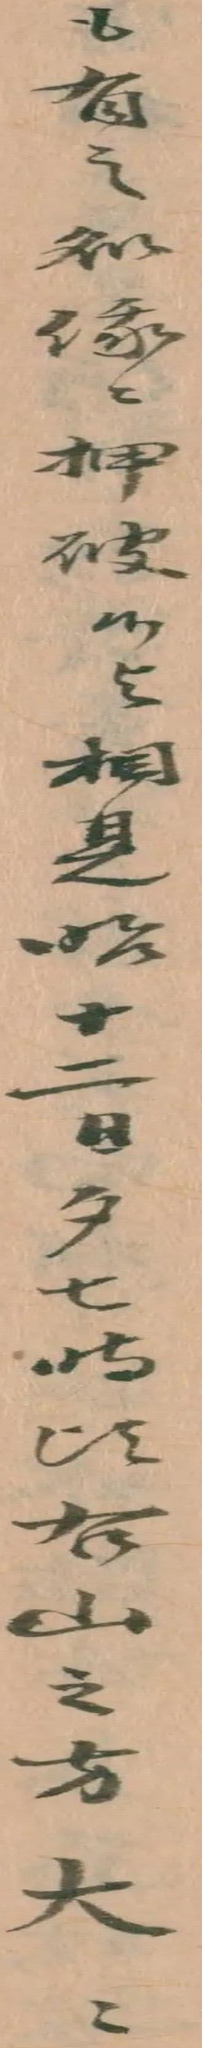も有処俄ニ押破候と相見昨十二日夕七時比右山之方大ニ
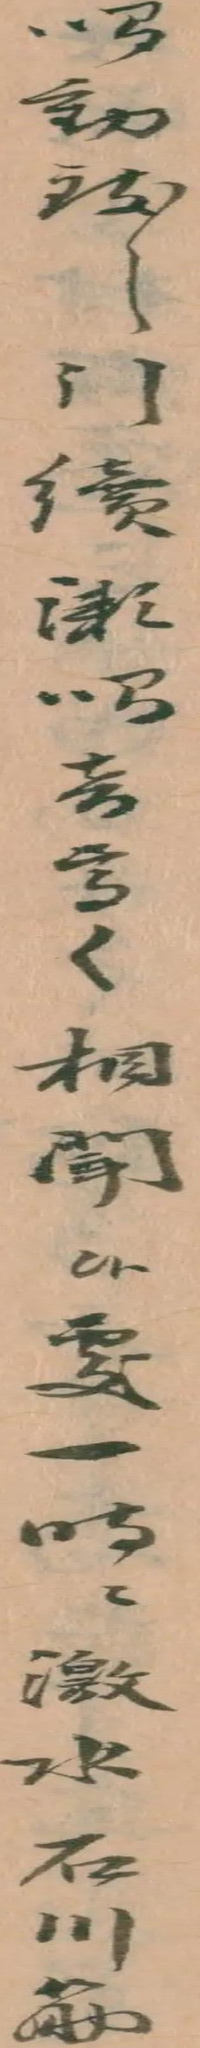鳴動致し引続瀬鳴音高く相聞候処一時二激水右川筋
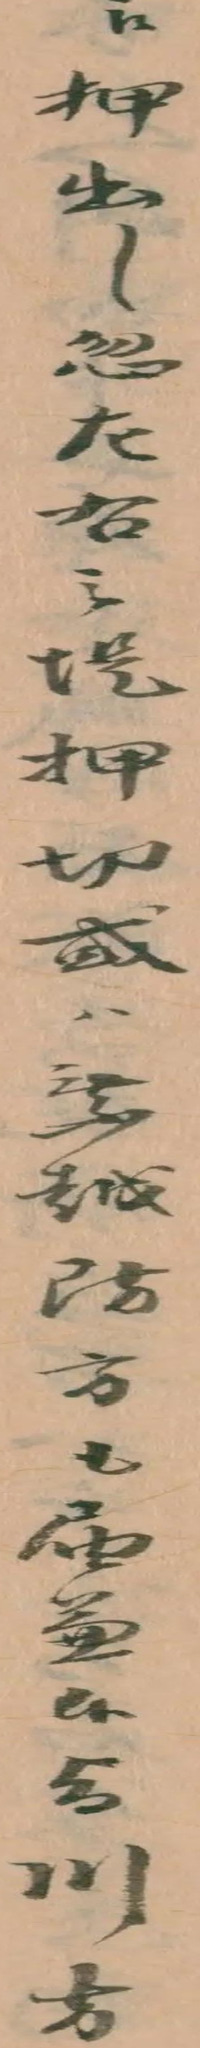江押出し忽左右之堤押切或ハ乗越防方も届兼候と川方
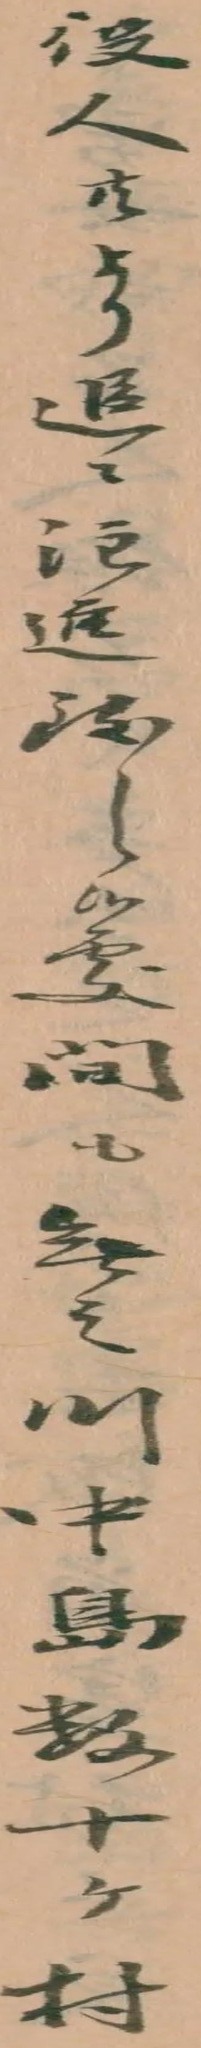役人共より追々注進致し候処間も無之川中島数十ケ村
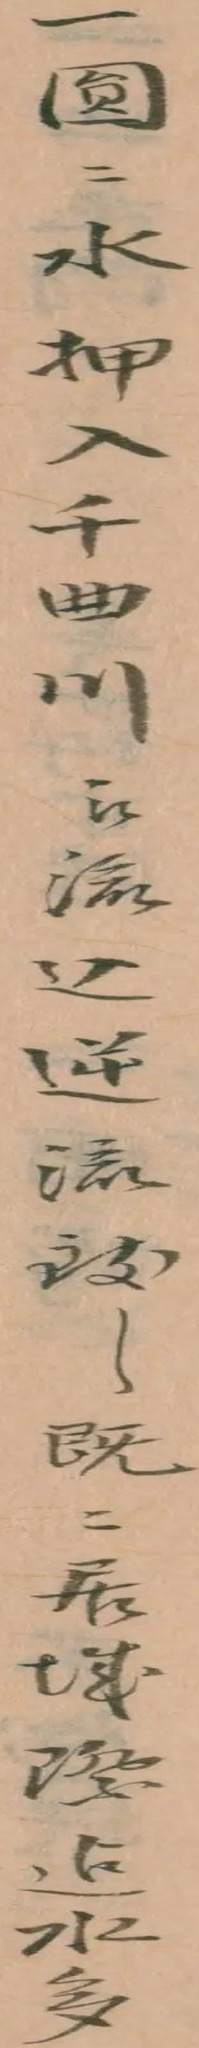一円ニ水押入千曲川江流込逆流致し既ニ居城際迄水多
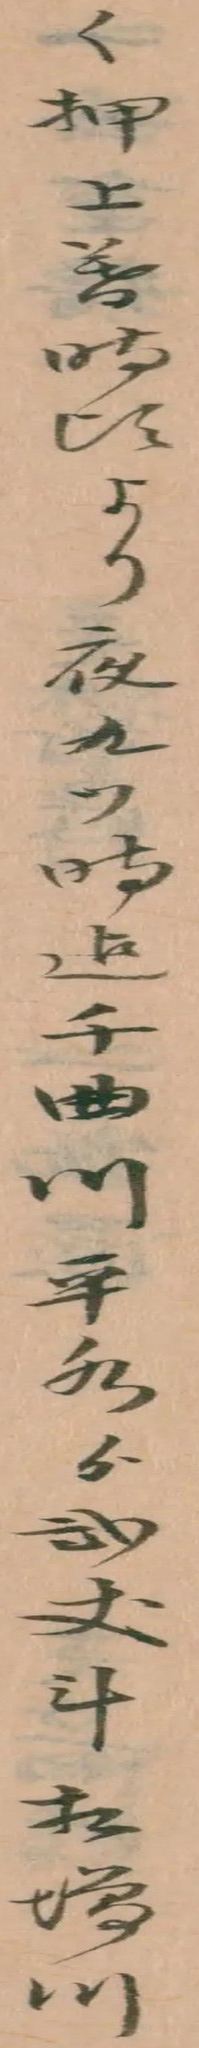く押上暮時比より夜九ッ時迄千曲川平水ゟ弐丈計相増川
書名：地災撮要. 巻3(地震之部)-巻4(噴火之部)
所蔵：国立国会図書館 National Diet Library, JAPAN
